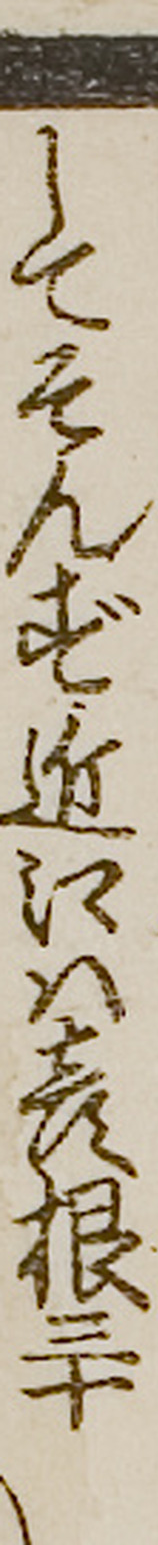してそんず近江は彦根三十
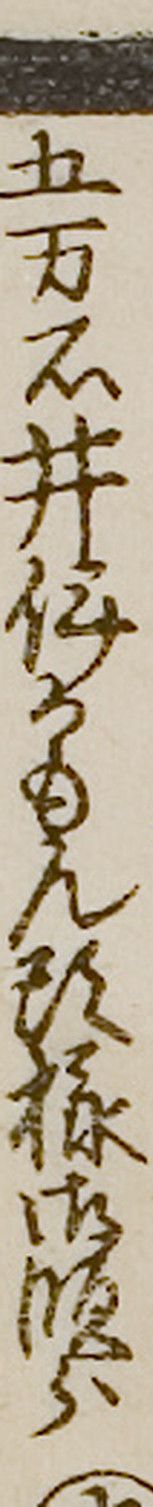五万石井伊かもん頭様御領分
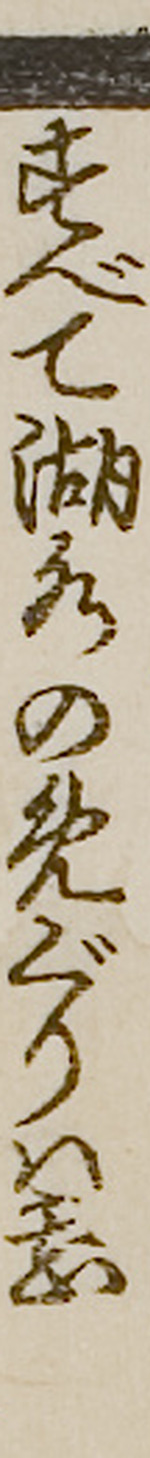すべて湖水のめぐりは甚
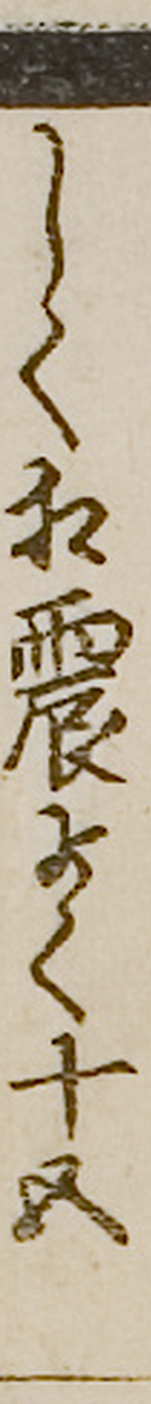しく相震よく十五
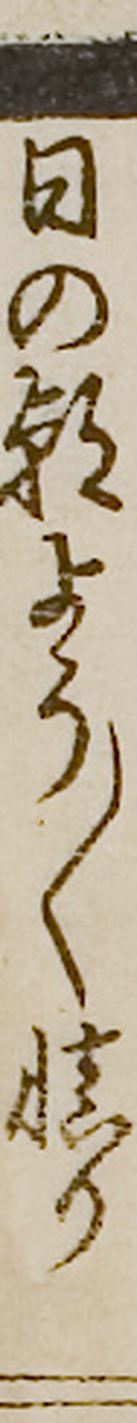日の朝よう〳〵慎り
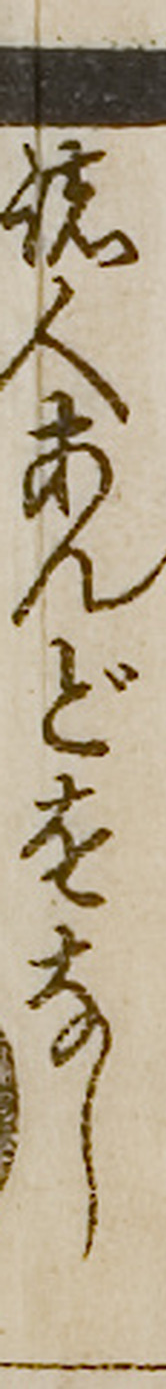諸人あんどをなし
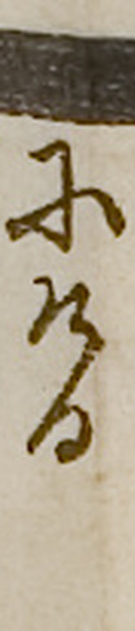にける
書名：伊勢伊賀志摩近江尾張美濃大地震の図
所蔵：東京大学総合図書館 General Library in the University of Tokyo, JAPAN
